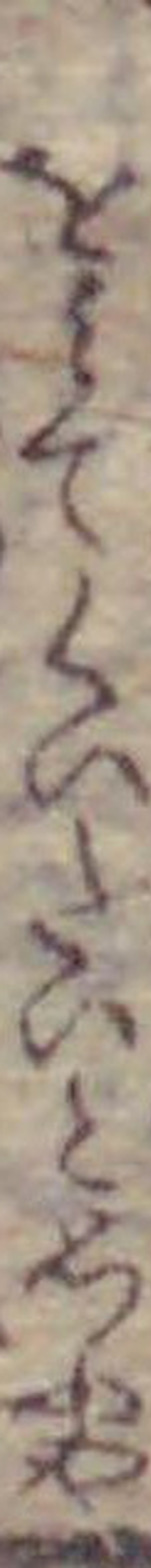をみてくいたいと思ふや
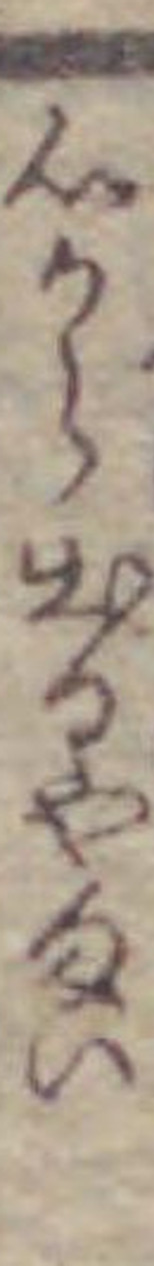心から出るやまい
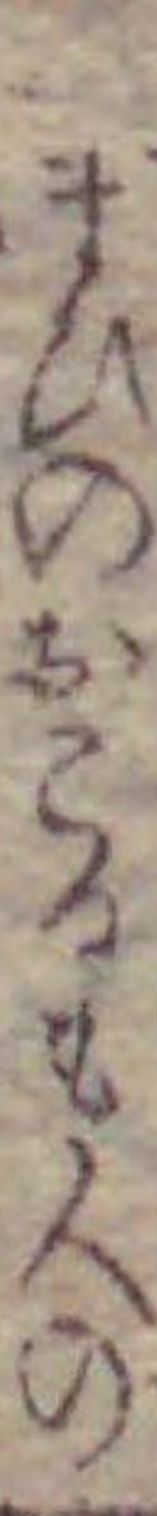まひのおこるも人の
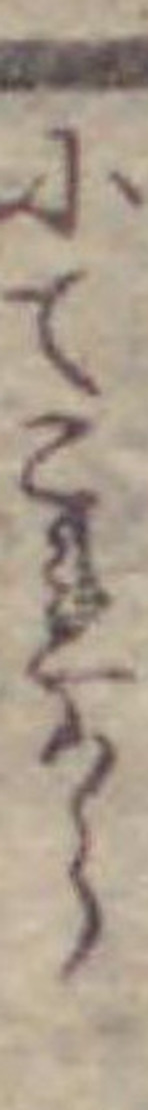にてこれから
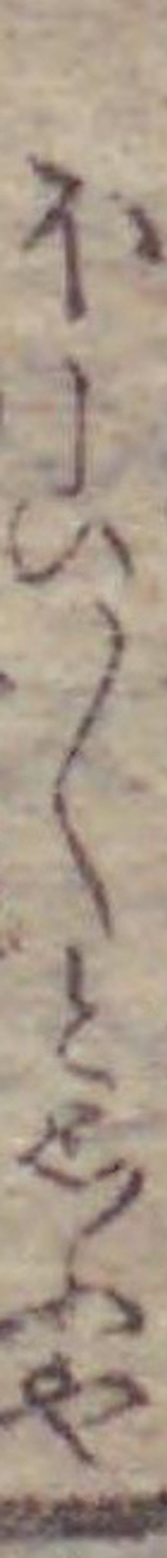ほしい〳〵と思ふや
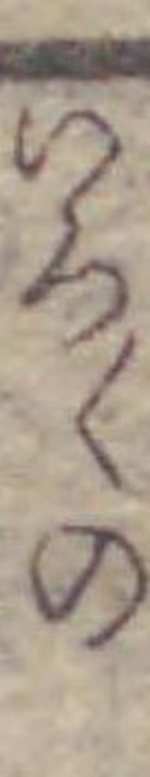いろ〳〵の
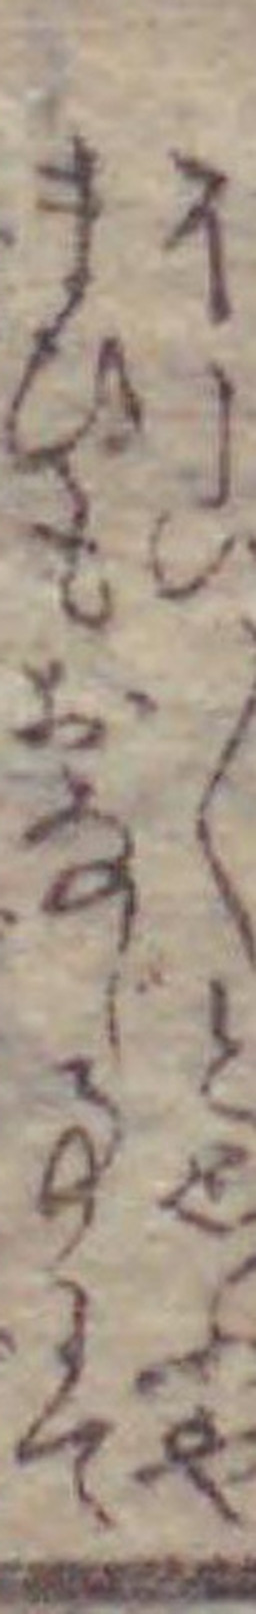まひもおなじ事にて
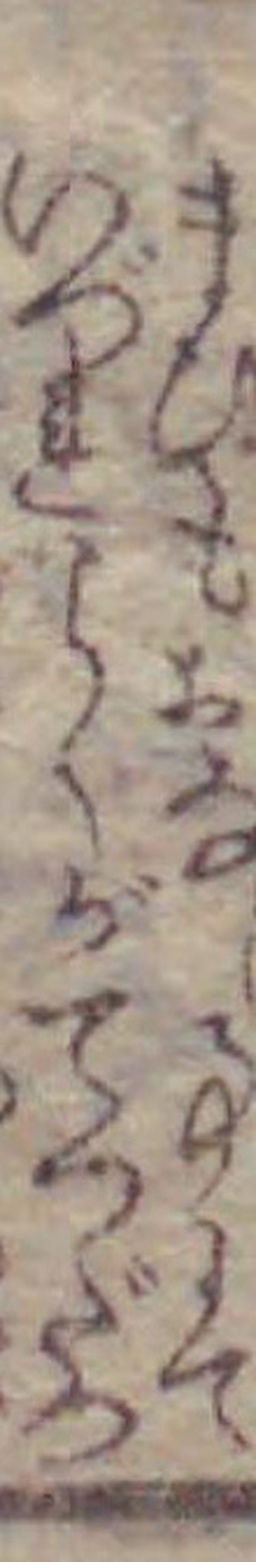いづれよくがてつだつ
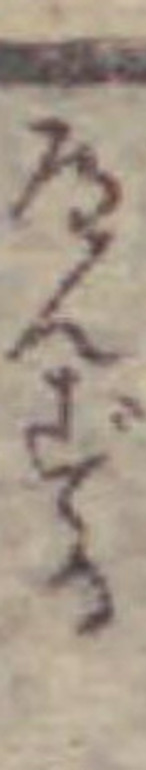へんずる
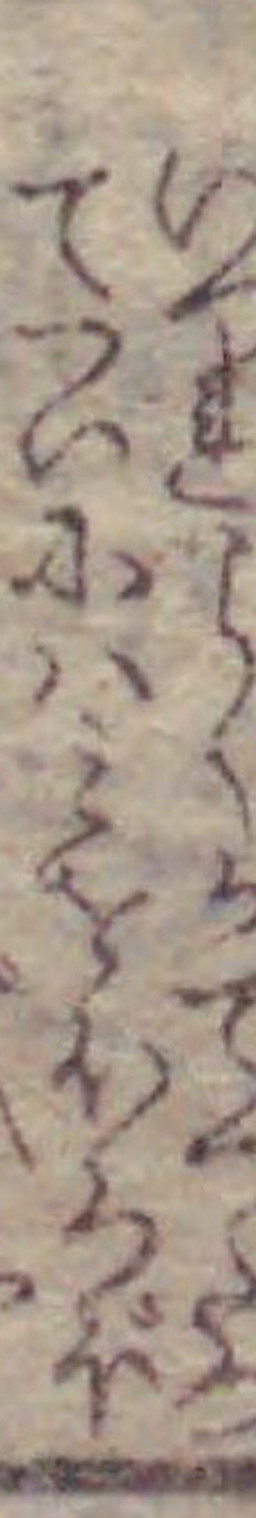てついにはみをほろぼ
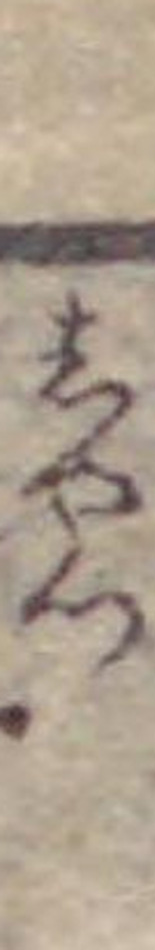しやつ
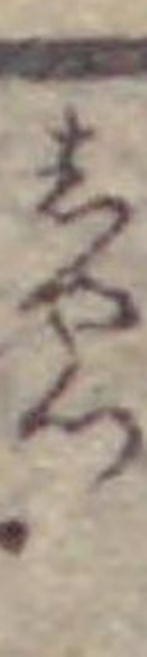しやつ
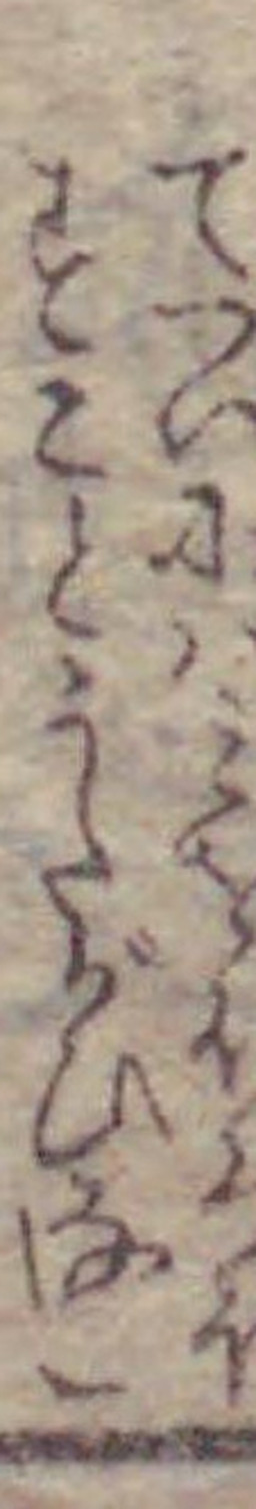すことうたがひなし
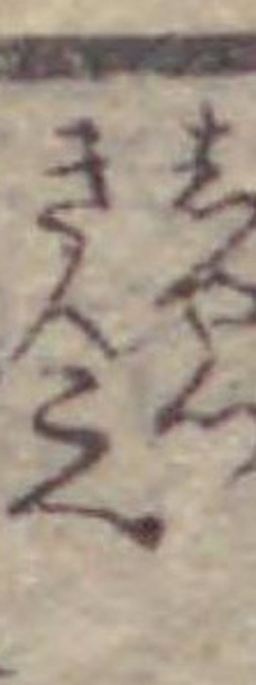きんこく
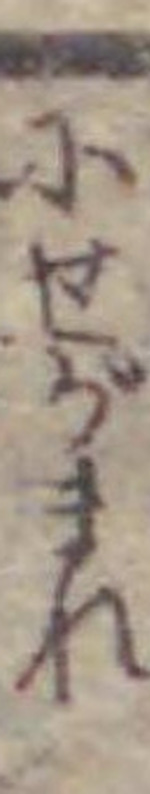にせがまれ
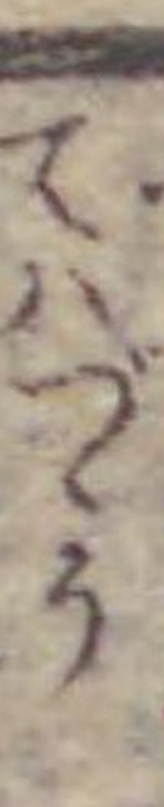てはづゝう
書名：鼻下長生薬 : 3巻
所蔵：国立国会図書館 National Diet Library, JAPAN
